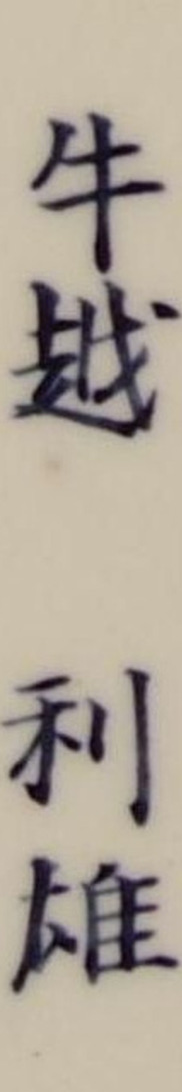牛越利雄
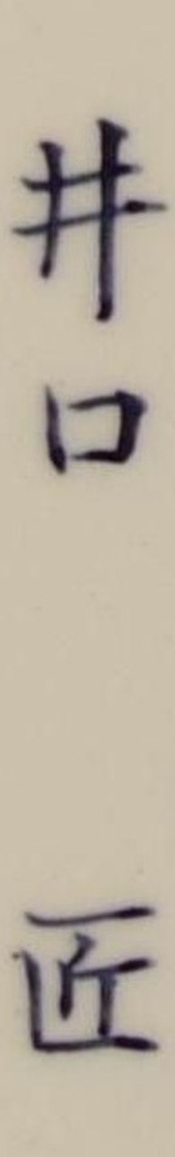井口匠
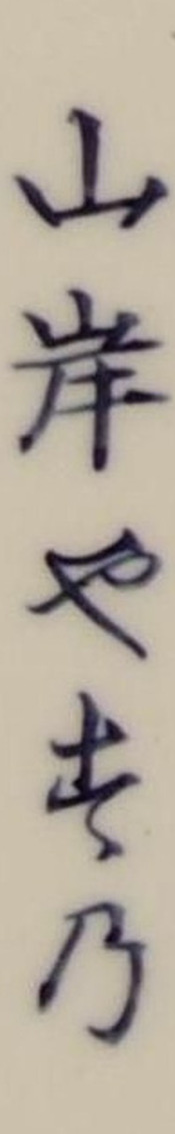山岸やすの
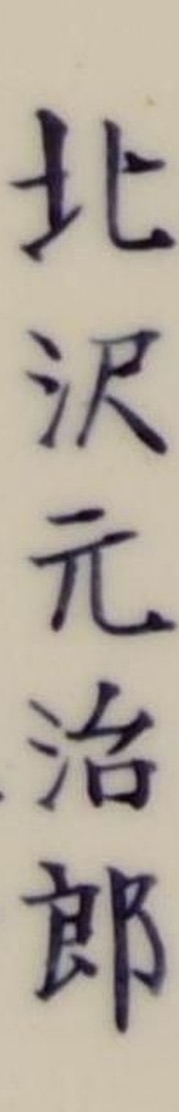北沢元治郎

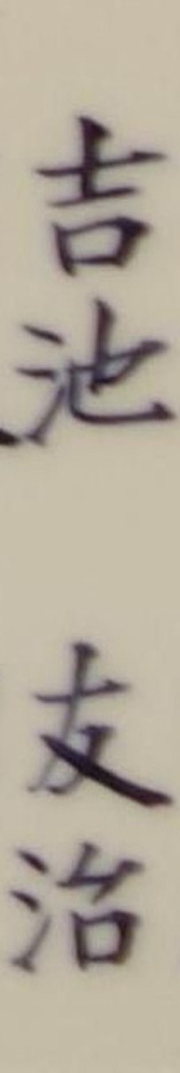吉池友治
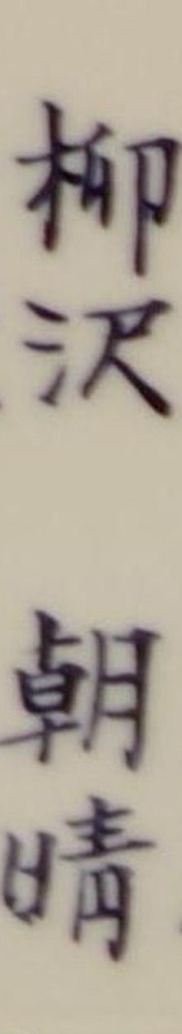柳沢朝晴
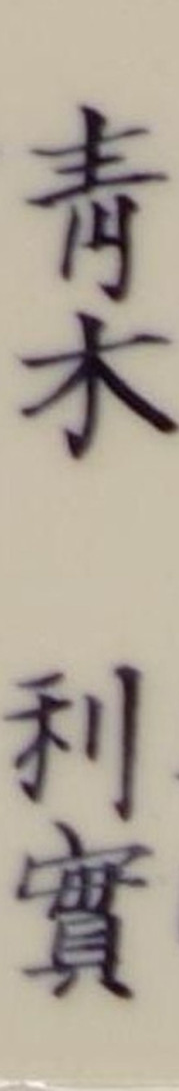青木利実
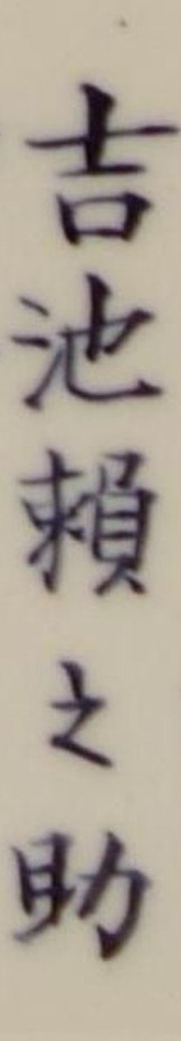吉池頼之助
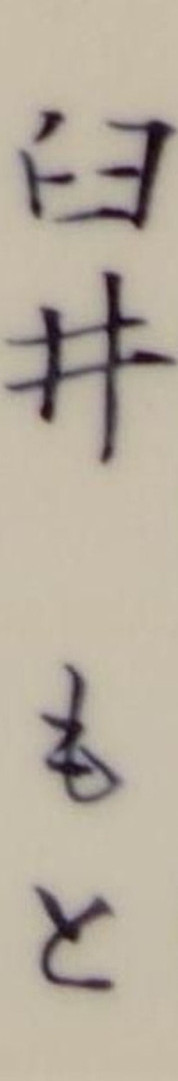臼井もと
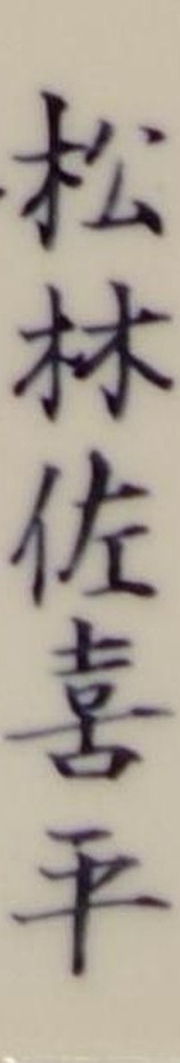松林佐喜平
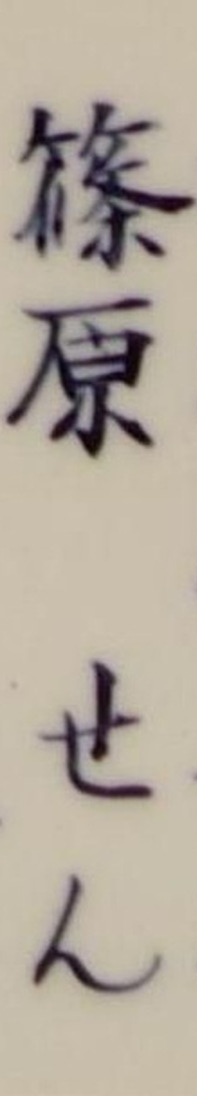篠原せん
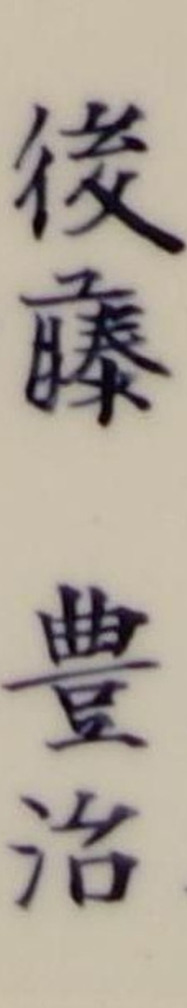後藤豊治
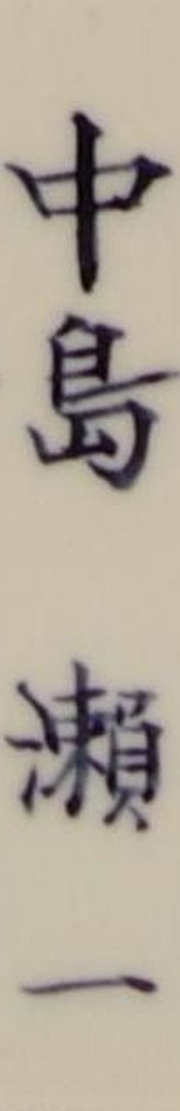中島瀬一
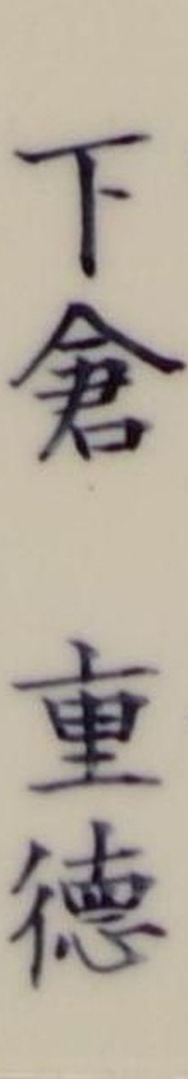下倉重徳
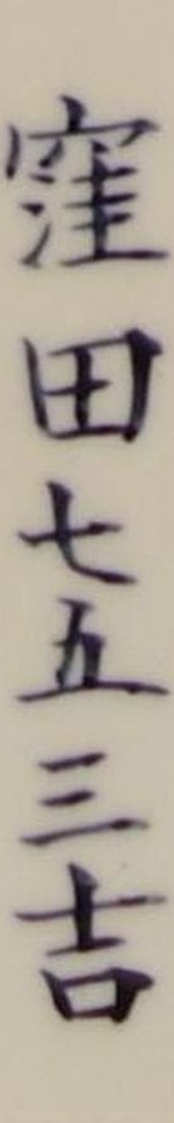窪田七五三吉
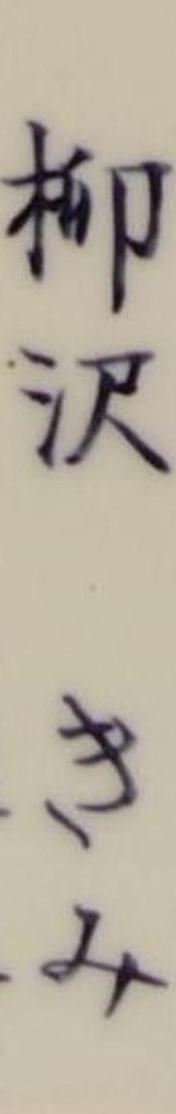柳沢きみ
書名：M~S
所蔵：高野山金剛峯寺
